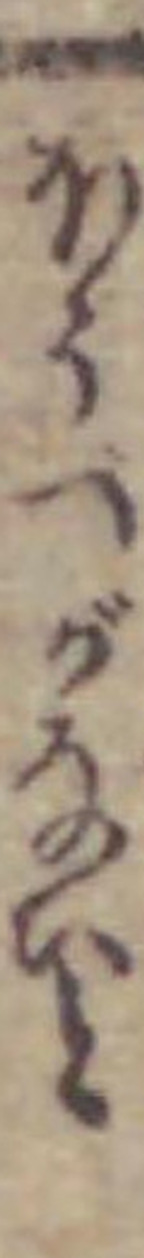ほうづがないと
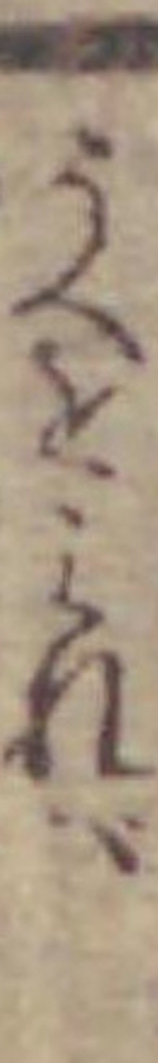うへをみれば
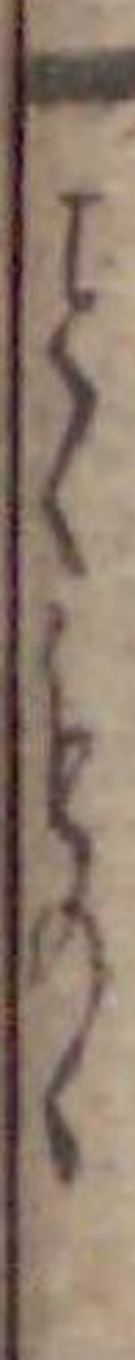ごとくものゝ
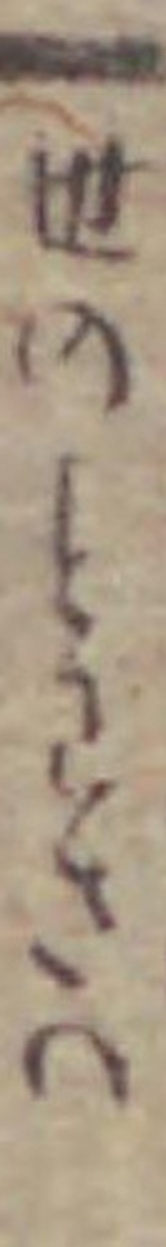世のことわさの
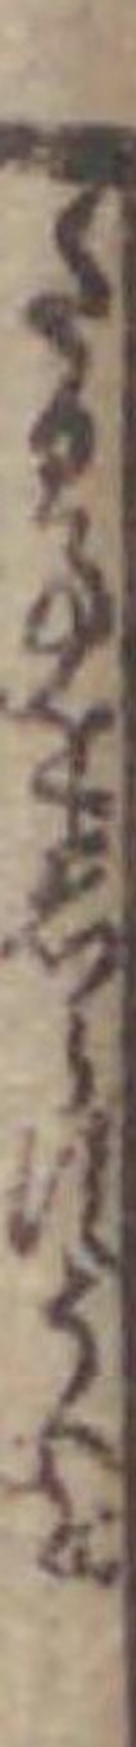たる事をしらすうへを
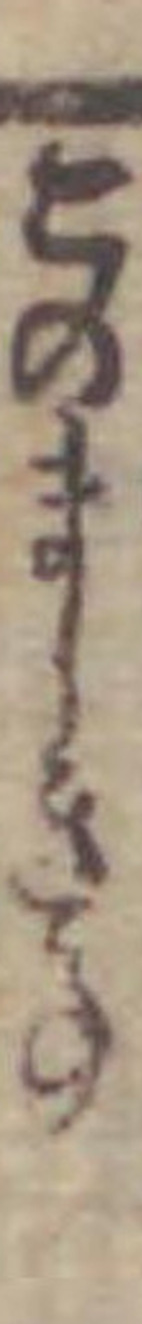このましき事
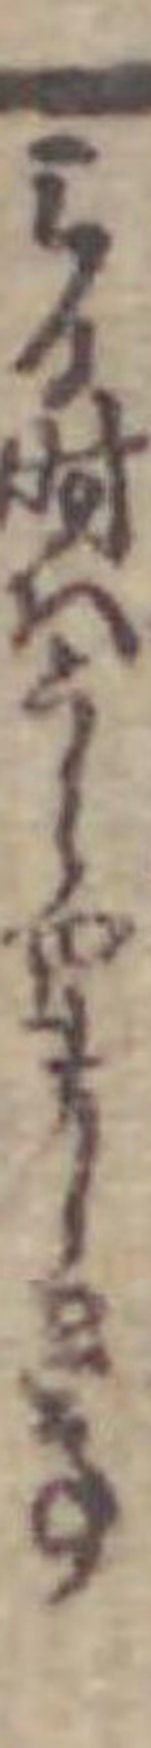みる時はうらやましき事
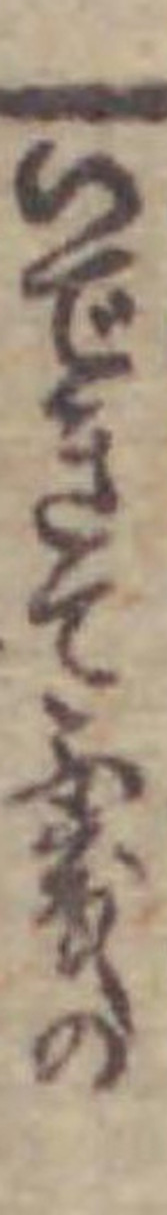いできて不義の
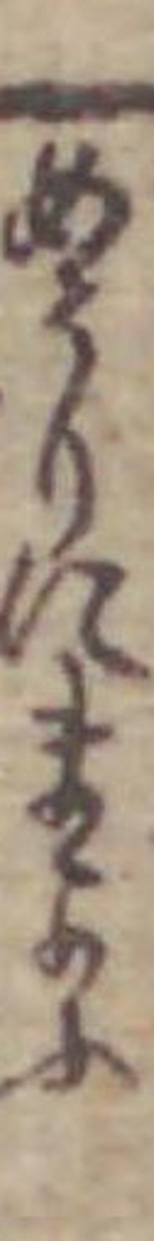めうりにまよふ
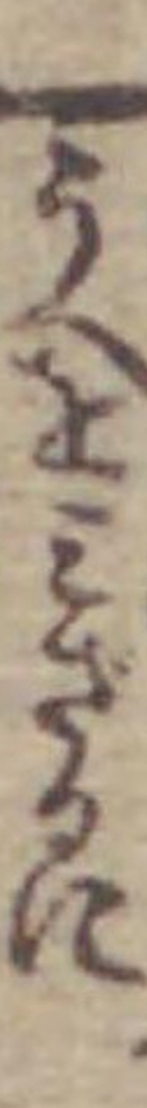うへをみざるに
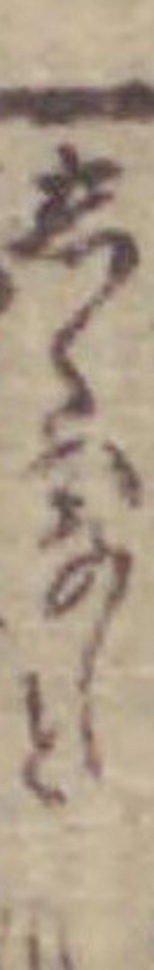しくはなし
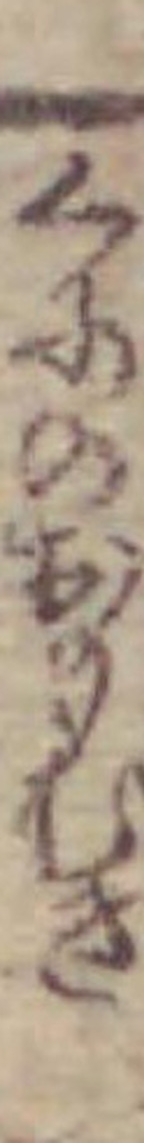くにのおもむき
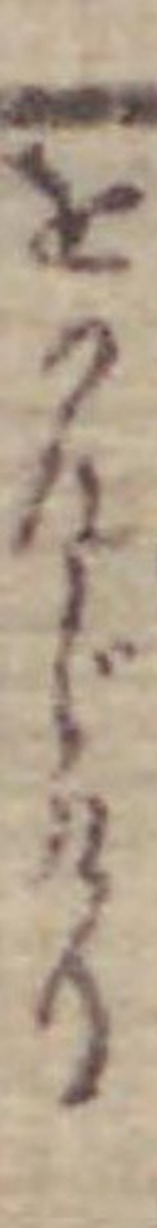をかんじけり
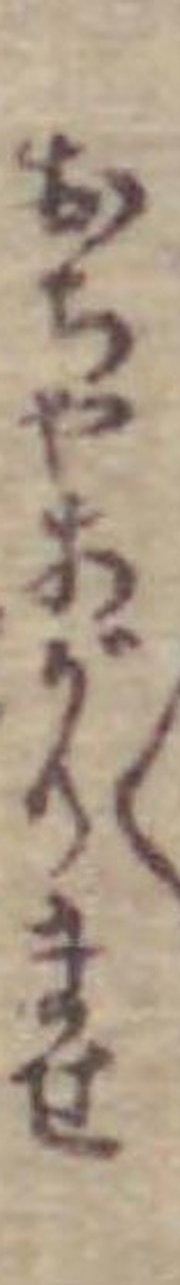おちやあがりませ
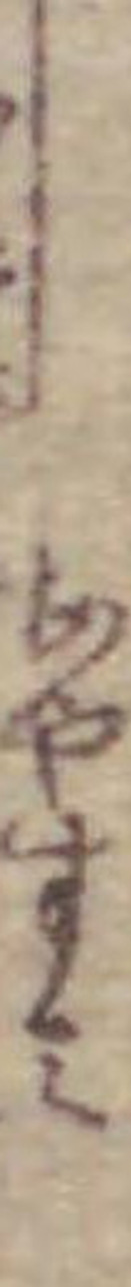おやすみ
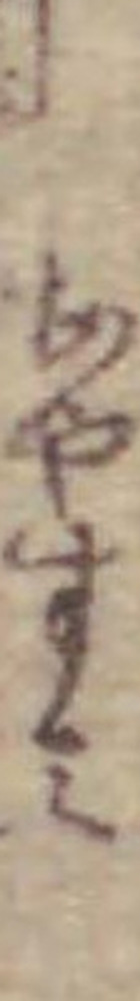おやすみ
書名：和荘兵衛後日話 : 3巻
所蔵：国立国会図書館 National Diet Library, JAPAN
